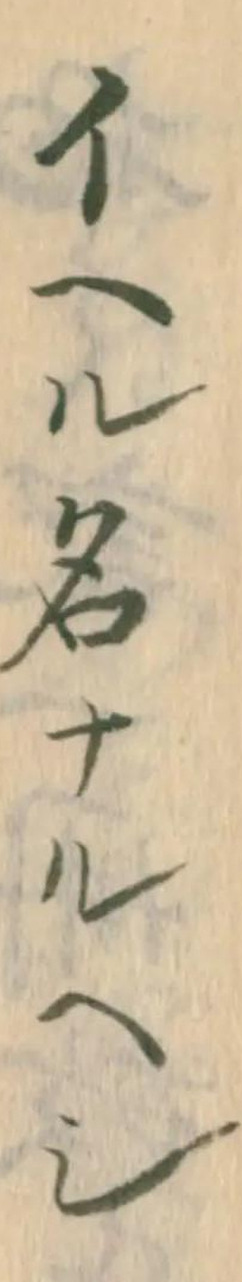イヘル名ナルヘシ
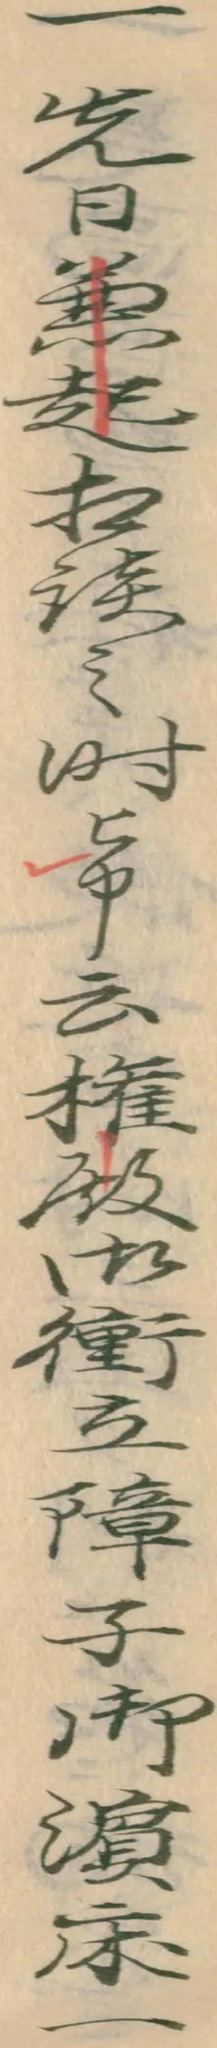一先日兼起相談之時被申云権-殿御衝立障子御浜床一
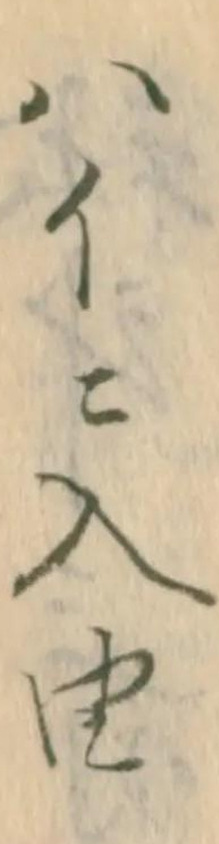ハイニ入由
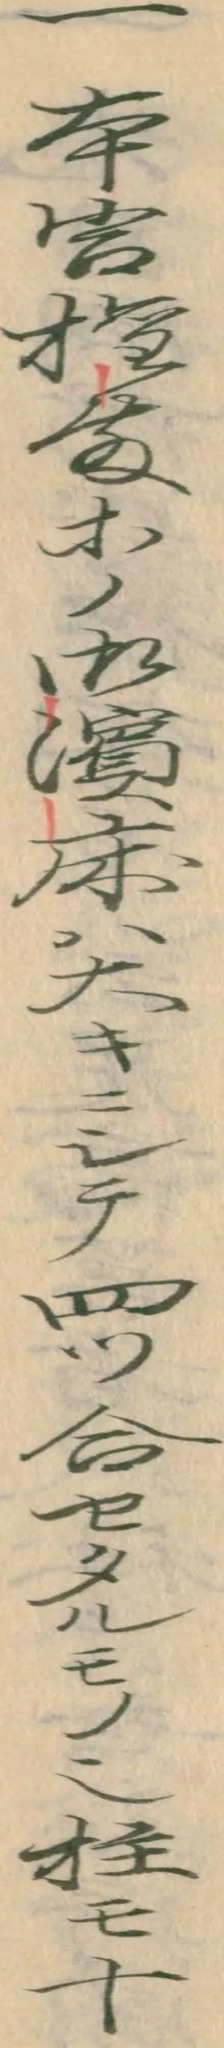一本宮権-殿等ノ御_浜_床ハ大キニシテ四ツ合セタルモノ也柱モ十
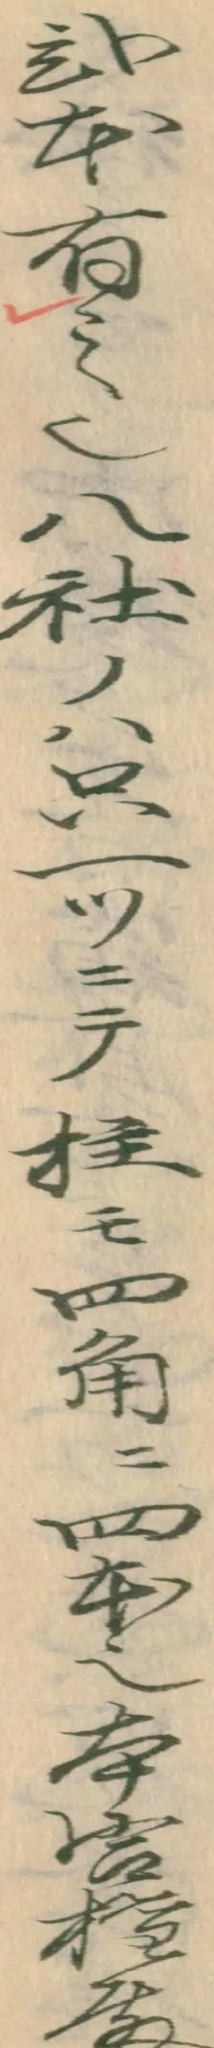弐本有之也八社ノハ只一ツニテ柱モ四角ニ四本也本宮権殿
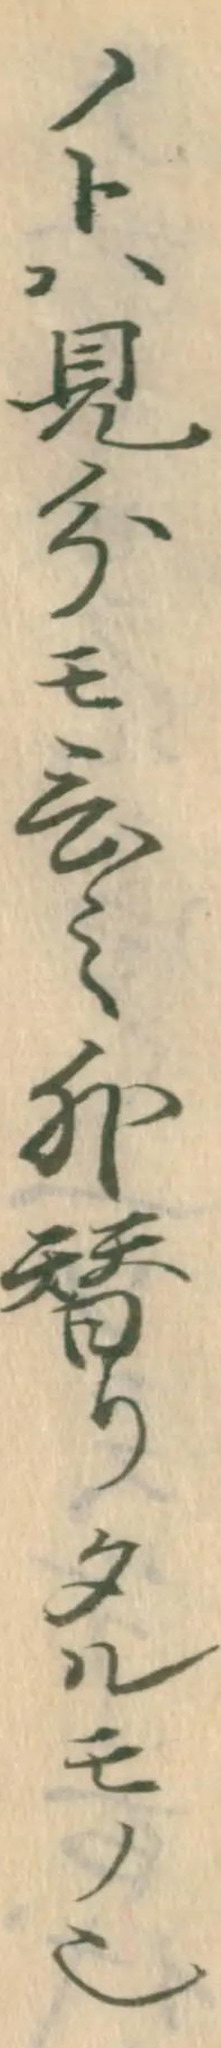ノトハ見分モ言之外替リタルモノ也
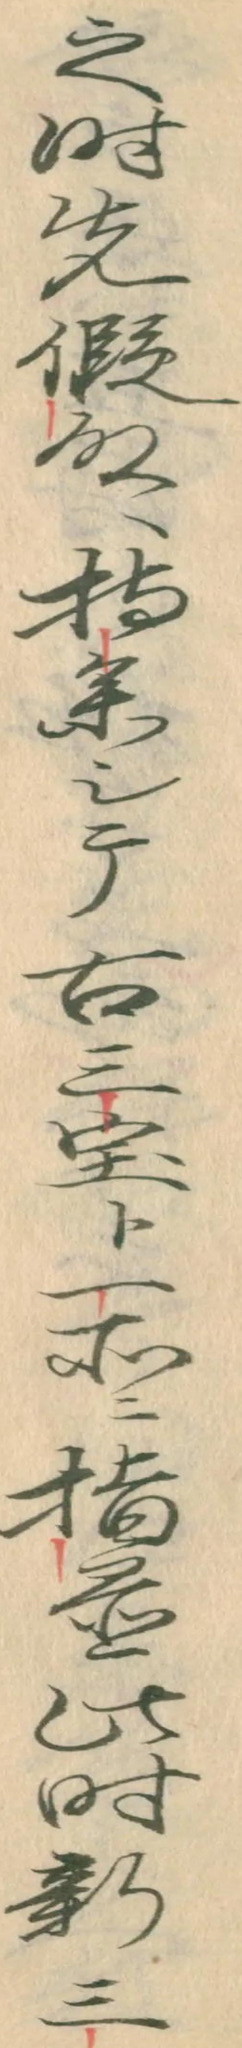之時先仮_殿へ持-参シテ古三-宝ト一-所ニ指_置此時新三-
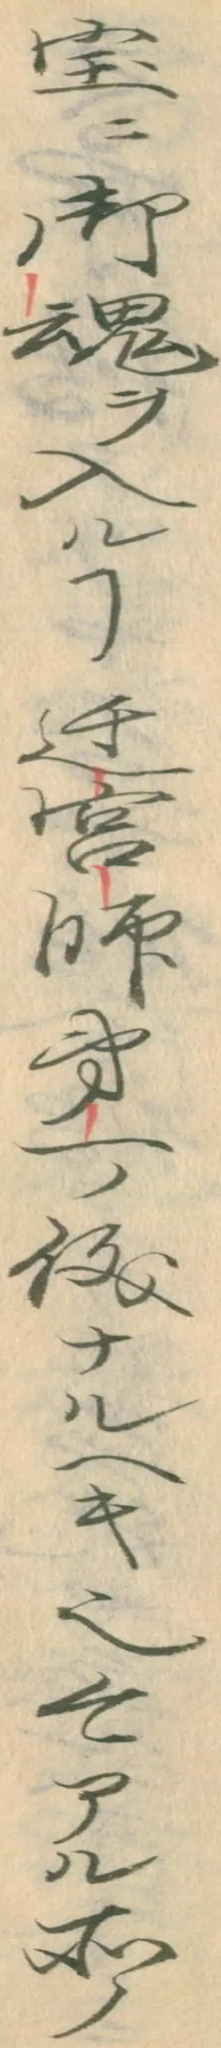宝ニ御_魂ヲ入ルコト迁-宮-師第-一ノ儀ナルヘキ也今アル所ノ
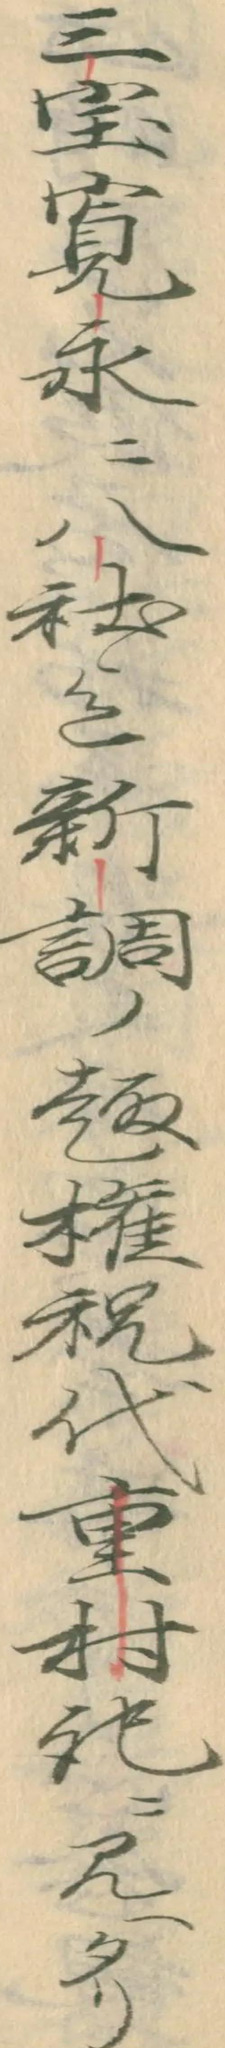三-宝寛-永ニ八-社迄新-調ノ趣権祝代重村記ニ見ヘタリ

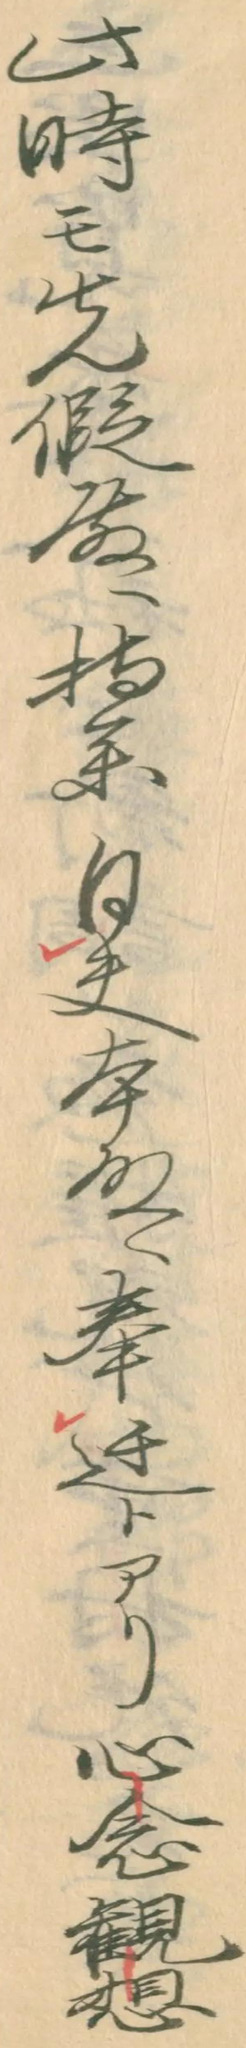此時モ先仮殿ヘ持参自夫本殿ヘ奉迁トアリ心-念観-想
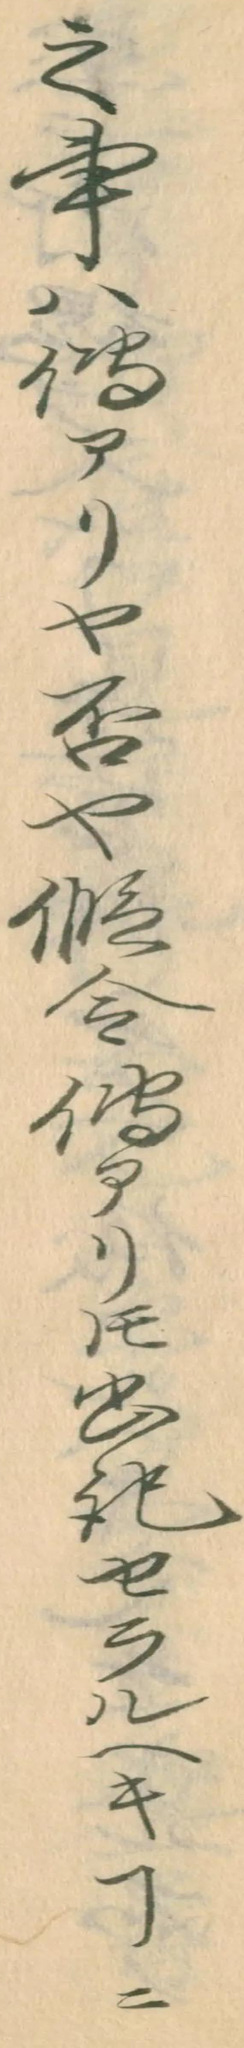之事ハ伝アリヤ否ヤ仮令伝アリトモ書記セラルヘキコトニ
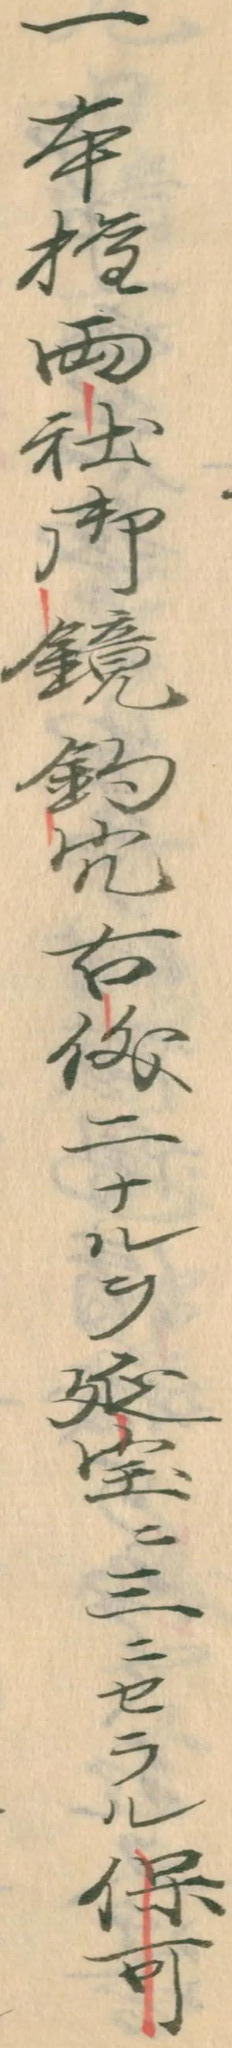一本権両-社御_鏡釣_穴右-儀二ナルヲ延-宝ニ三ニセラル保可
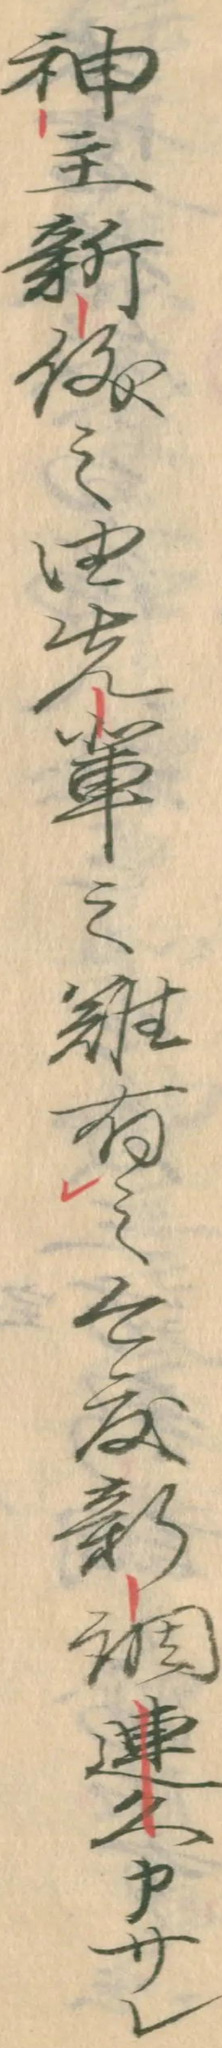神_主新-儀之由先-輩之難有之今度新-調連久申サレ
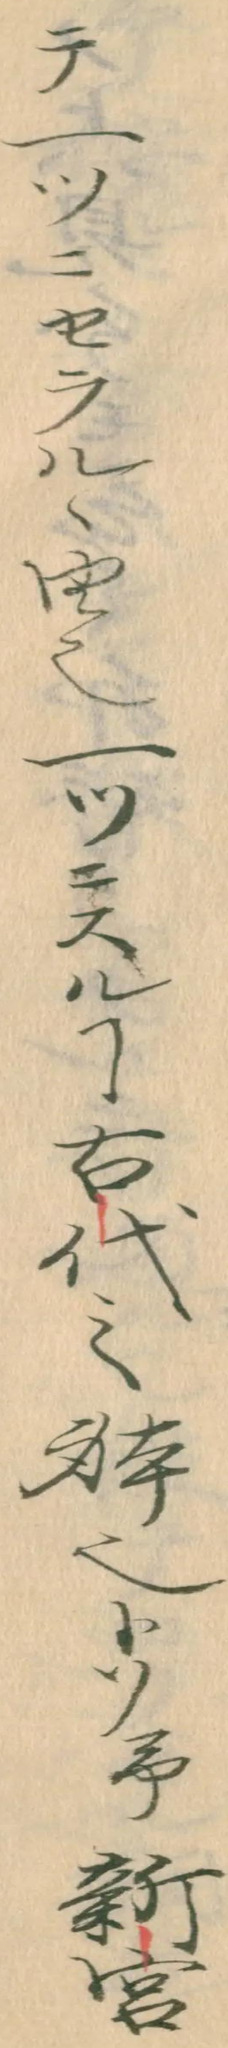テ一ッニセラルヽ由也一ツニスルコト古-代之体也トソ予新-宮
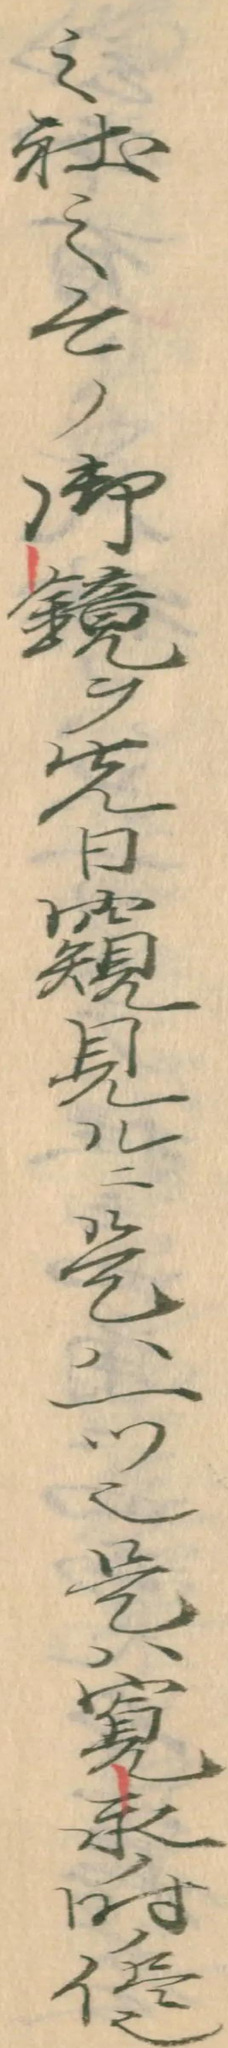之社之今ノ御_鏡ヲ先日窺見ルニ是ハ一ツ也是ハ寛-永ノ時ノ侭也
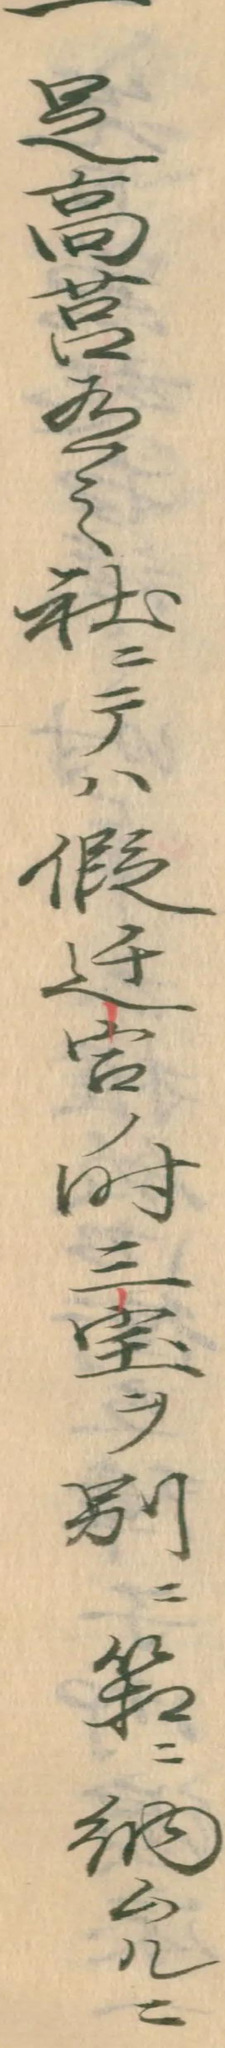一足高莒有之社ニテハ仮迁-宮ノ時三-宝ヲ別ニ箱ニ納ムルニ
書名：賀茂社記録. 第15冊
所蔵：国立国会図書館 National Diet Library, JAPAN
